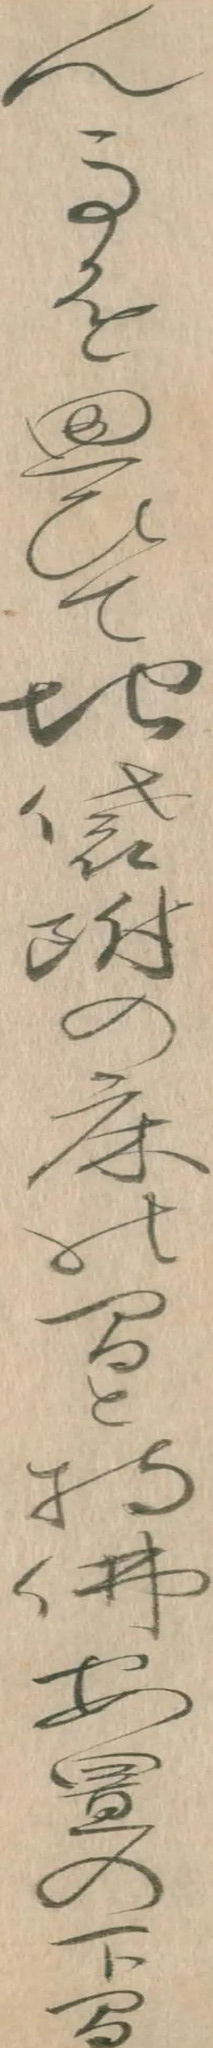ん事を思ひて地袋附の床の間と持佛安置の一ト間
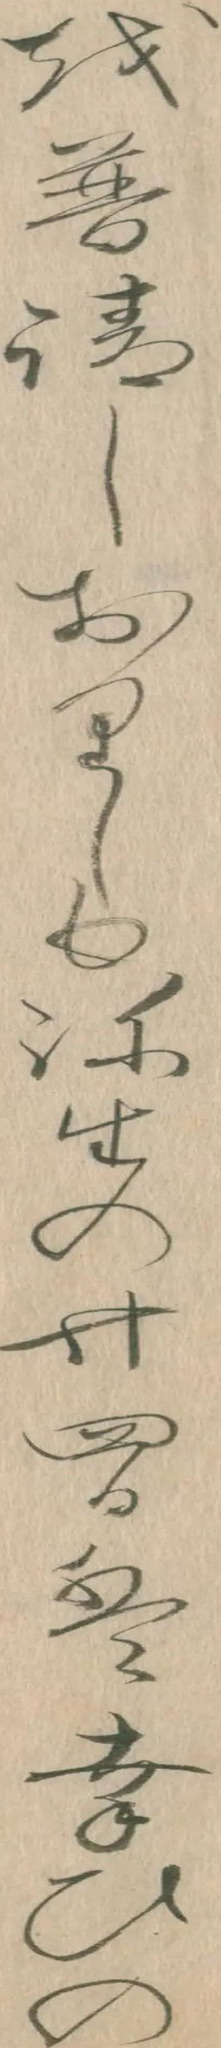を普請しおりしも弥生の廿四日は幸ひの
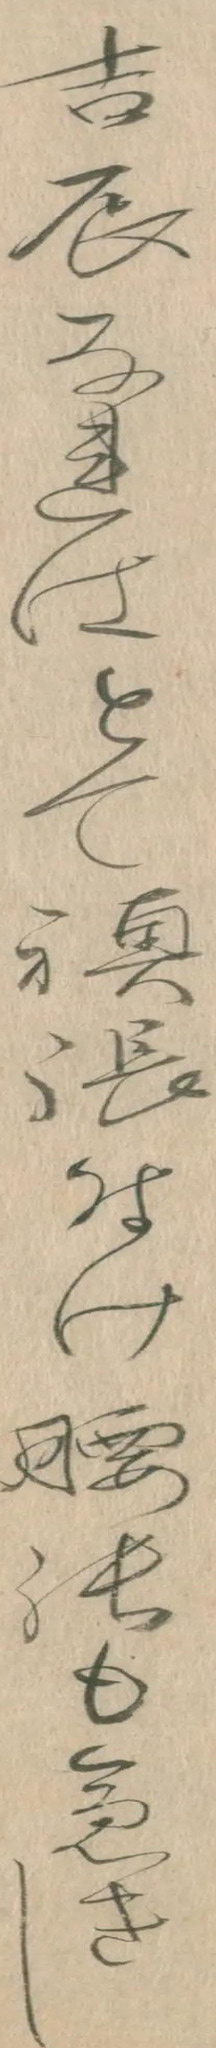吉辰なれはとて襖張付け腰張も急きし
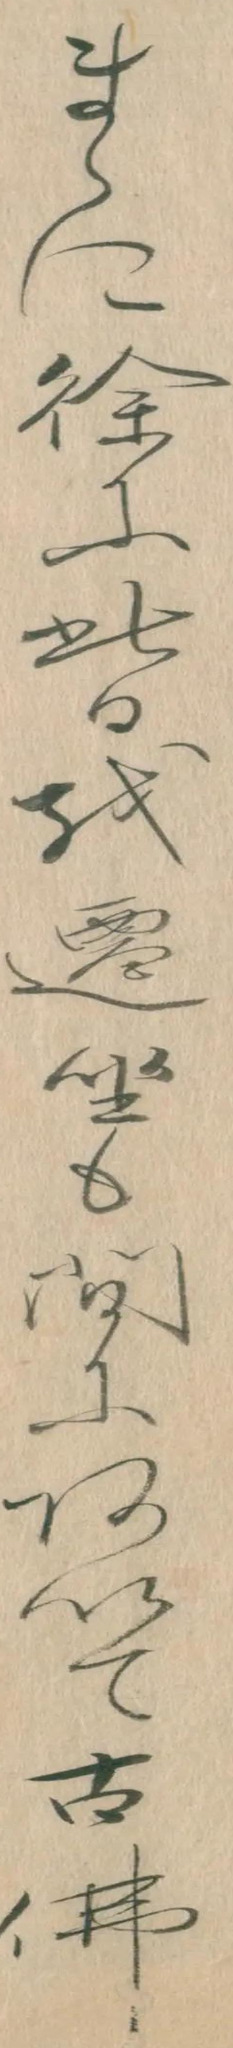まゝに徐に此日を遷坐も間にあいて古佛
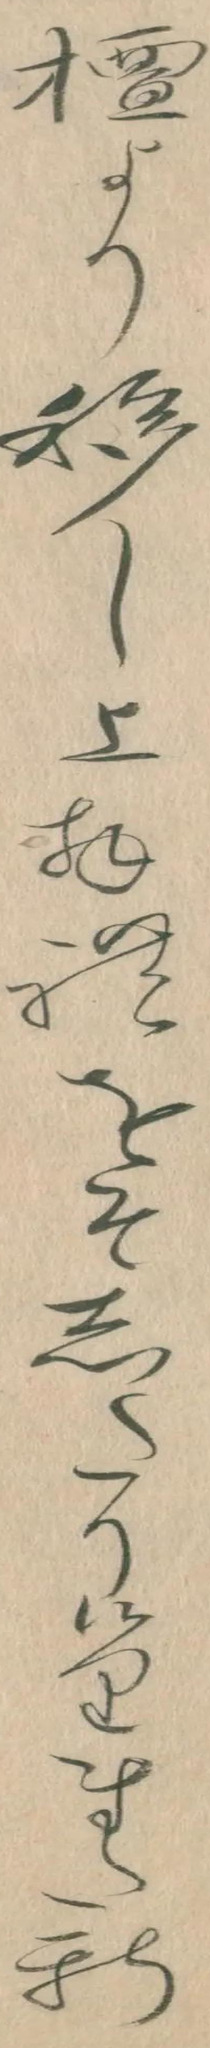壇より移し上拝禮をそしたりけりまた新
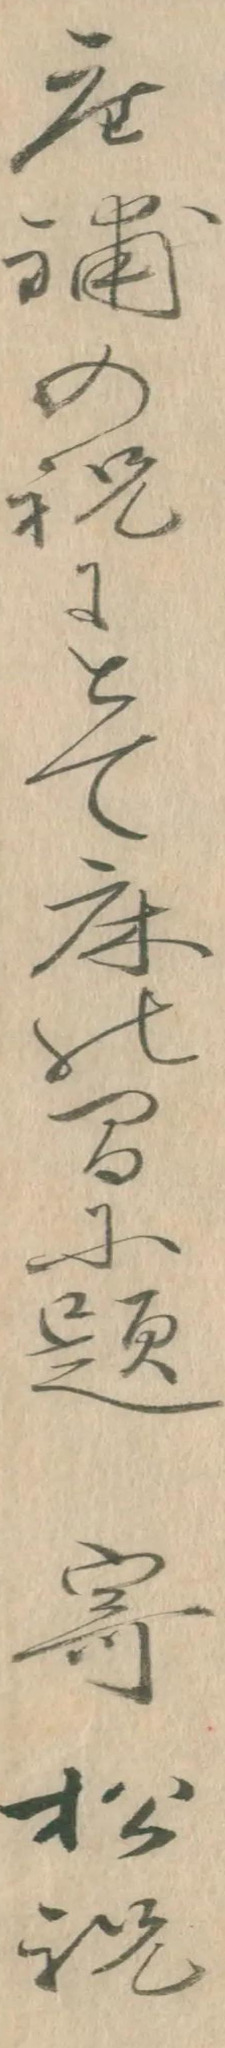座鋪の祝にとて床の間に題寄松祝

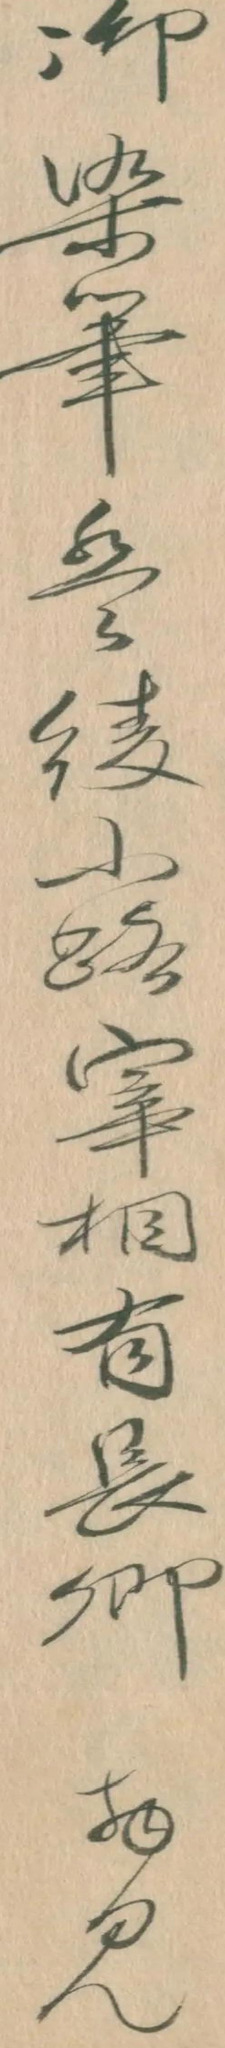御染筆は綾小路宰相有長卿拝見
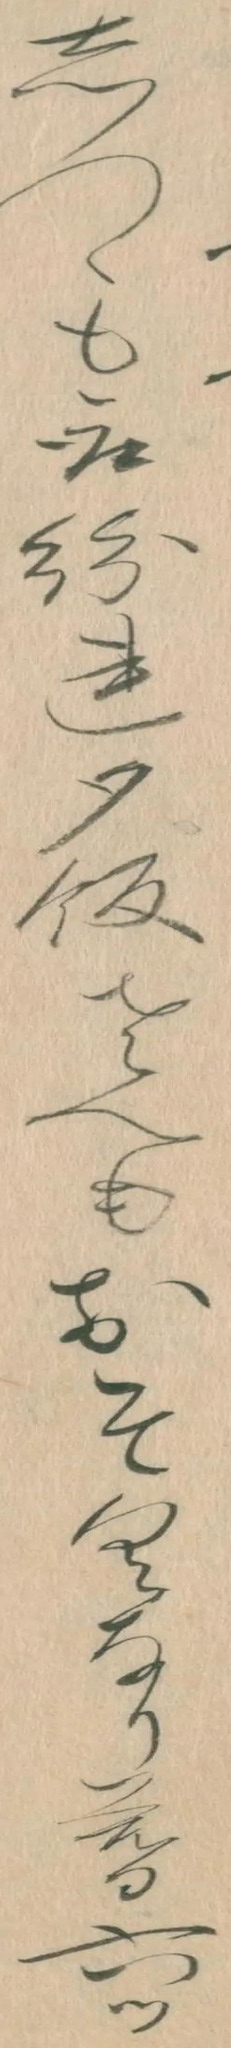しつゝも取紛れ夕飯さへもおそくなり暮六ツ
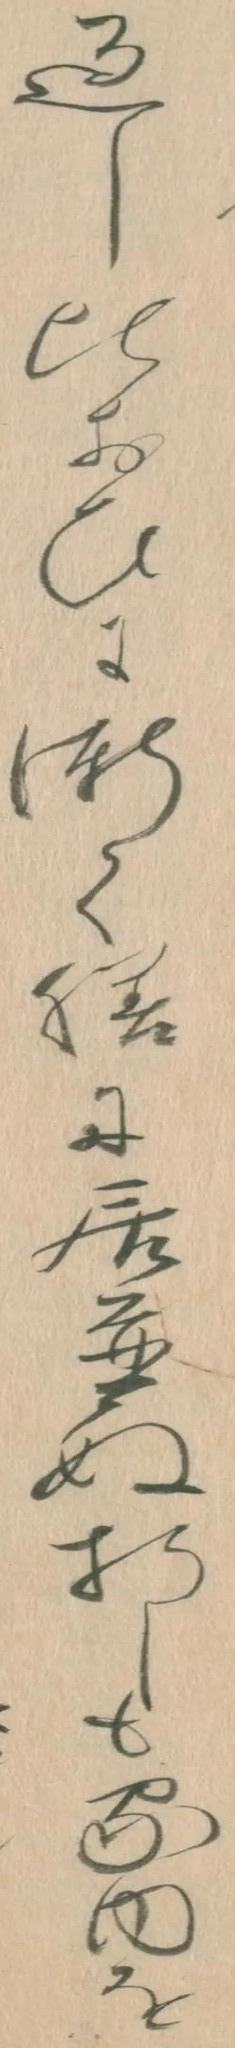過し比おひにに漸く膳に居並ぬ折しも家内を
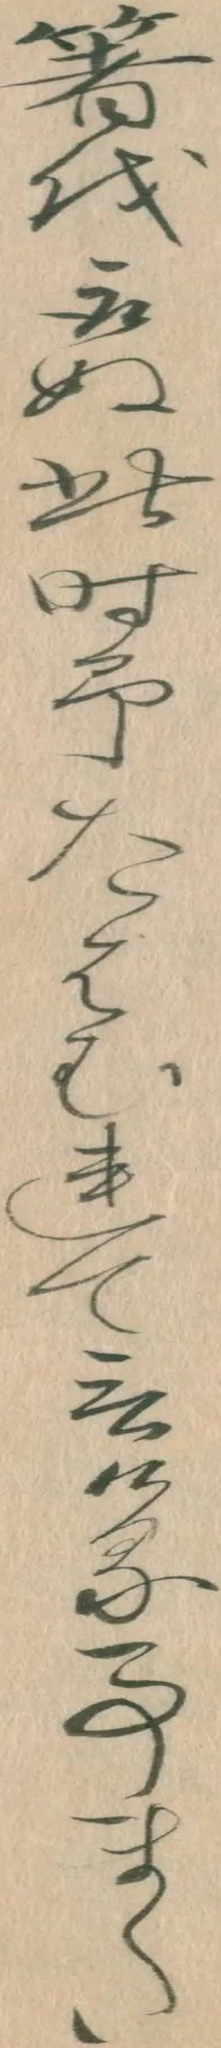箸を取ぬ此時予たわむれて言ける事また
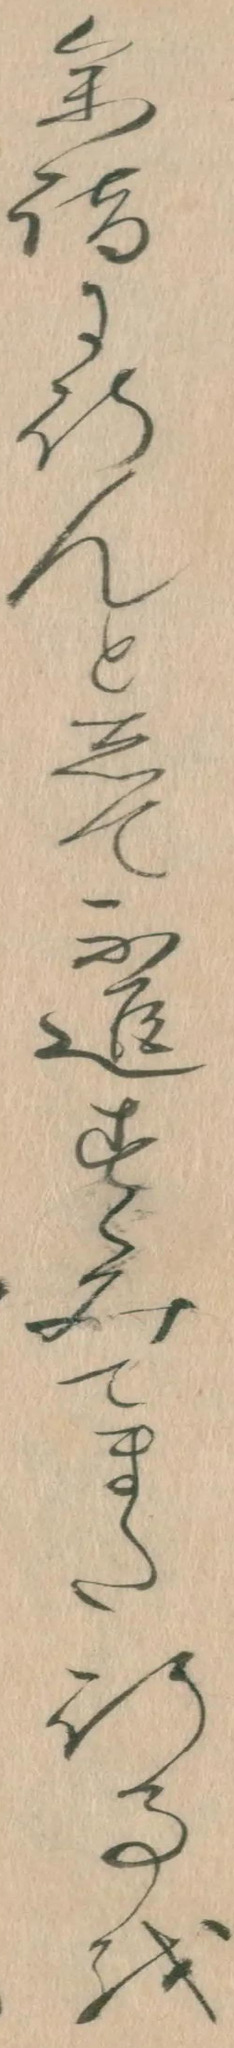参詣に行んとして不進すくみてまた行事を
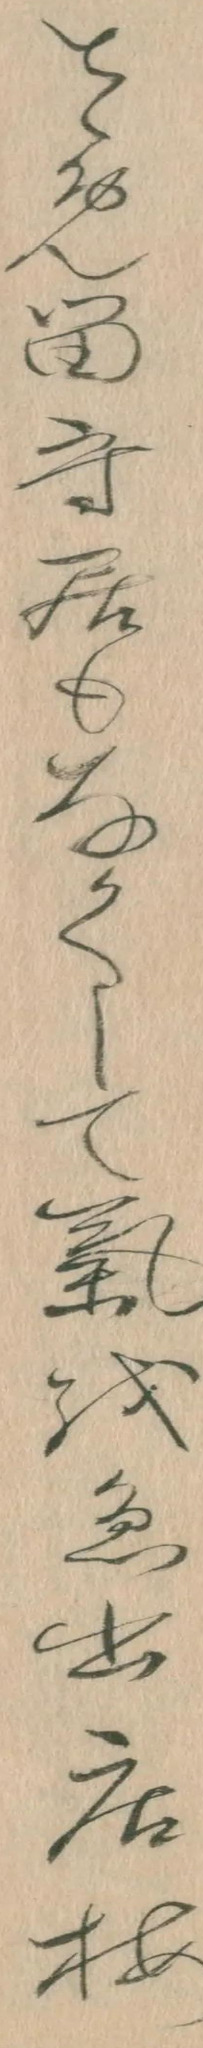とゝめ留守居もなくして氣を急出店梅
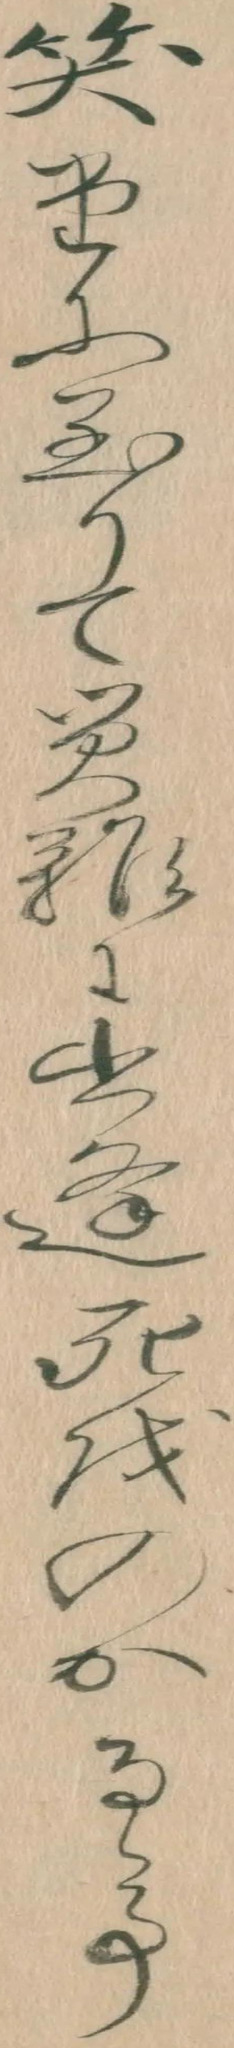笑堂に至りて災難に出逢死をのかるゝ事
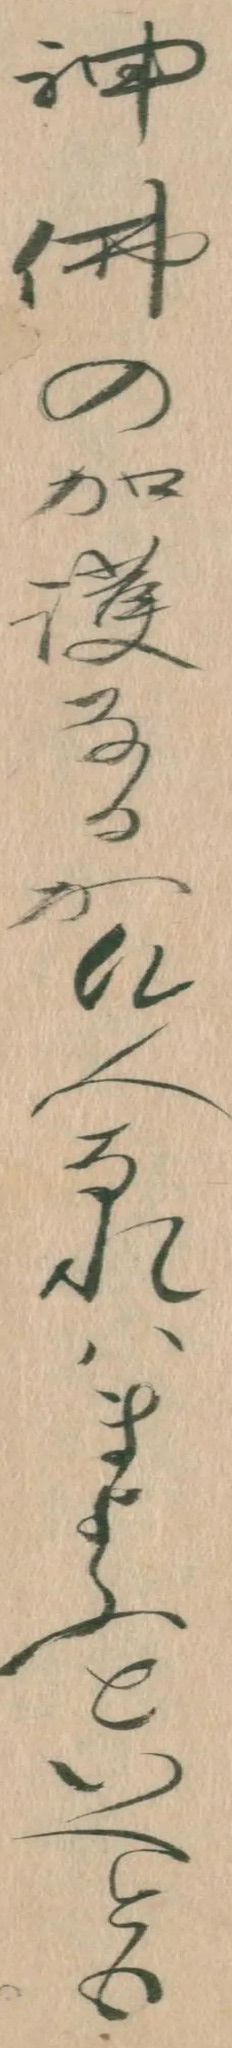神佛の加護なるか凡人なれはまよふといへとも
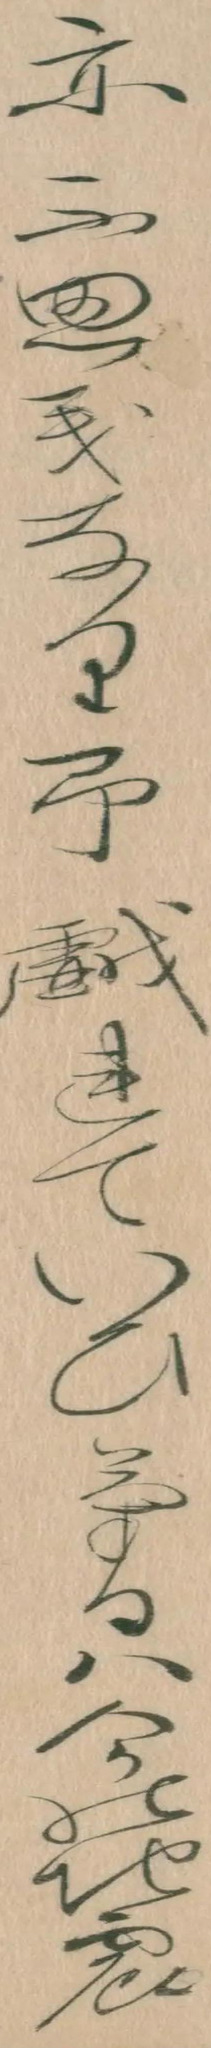亦ふしきなり予戯れていひけるは今の地震
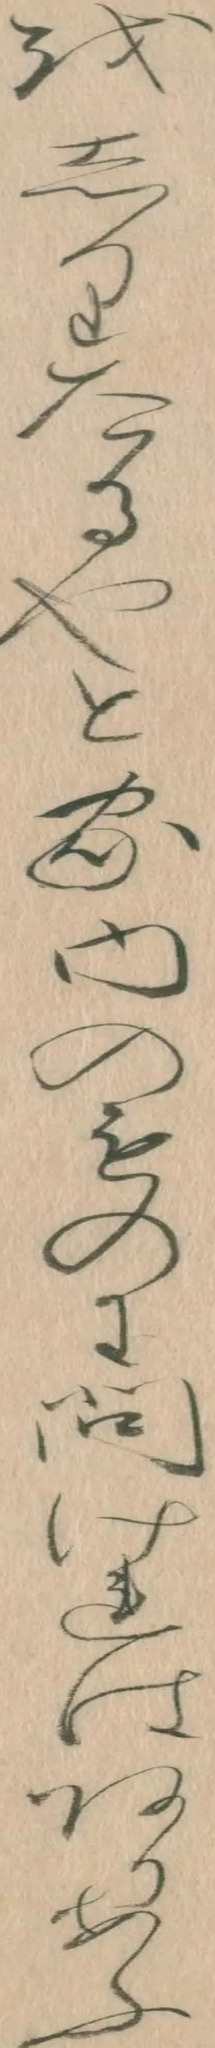をしりたるやと家内のものに問けれはありあふ
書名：俗語之種. [2]
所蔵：国立国会図書館 National Diet Library, JAPAN
